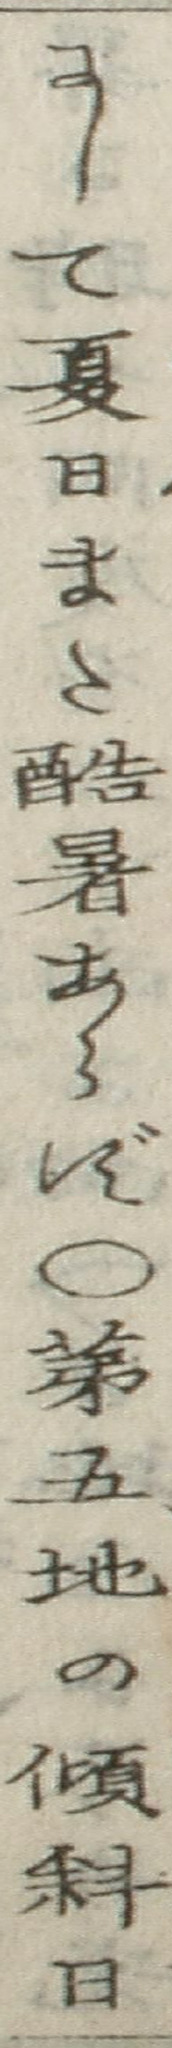にして夏日また酷暑あらず○第五、地の傾斜日
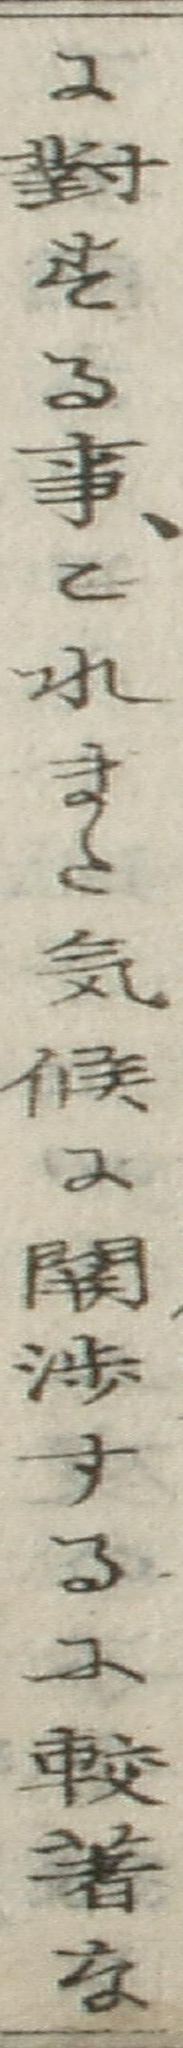に対する事、これまた気候に関渉するに較著な
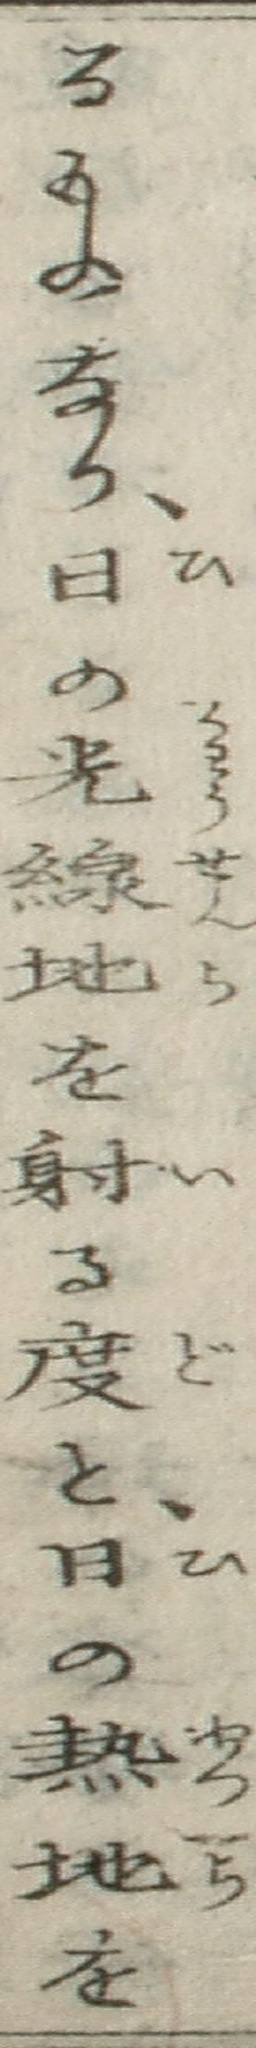るものなり、日の光線地を射る度と、日の熱地を

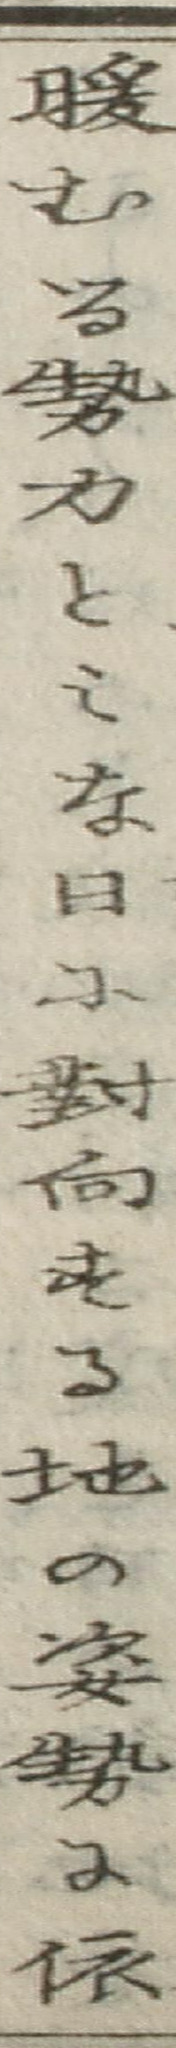暖むる勢力と、みな日に対向する地の姿勢に依
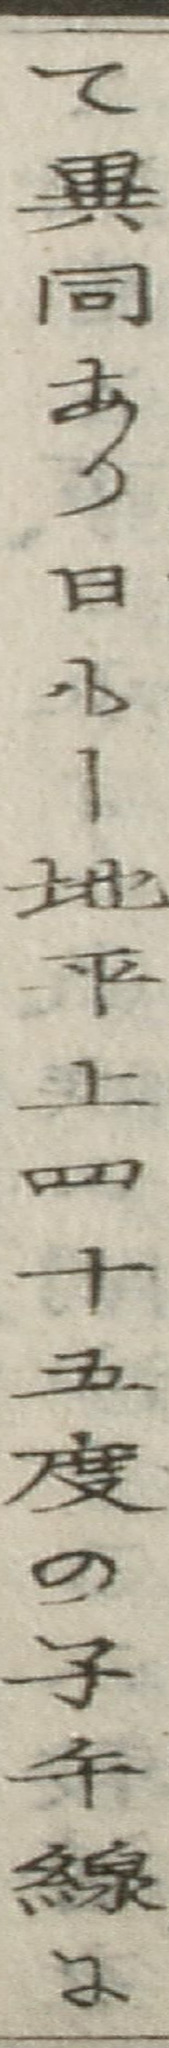て異同あり、日もし地平上四十五度の子午線に
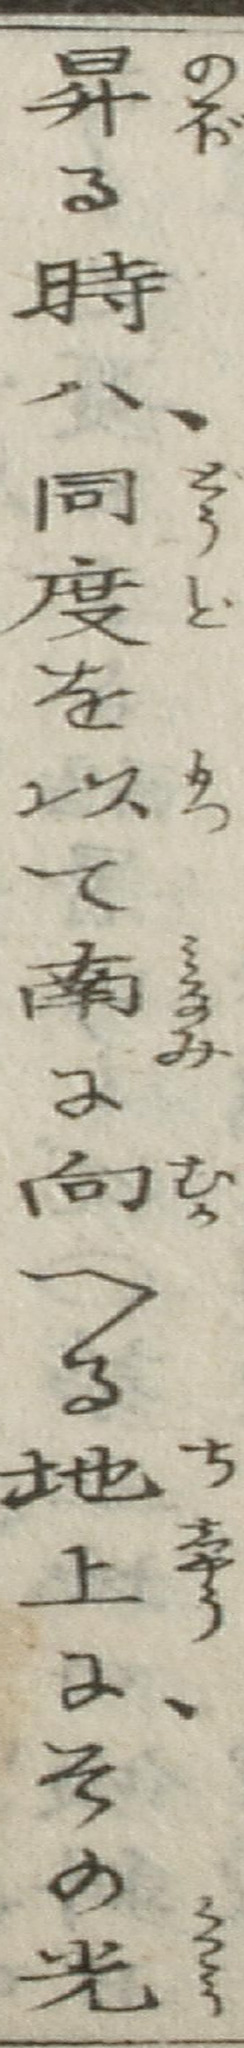昇る時は、同度を以て南に向へる地上に、その光
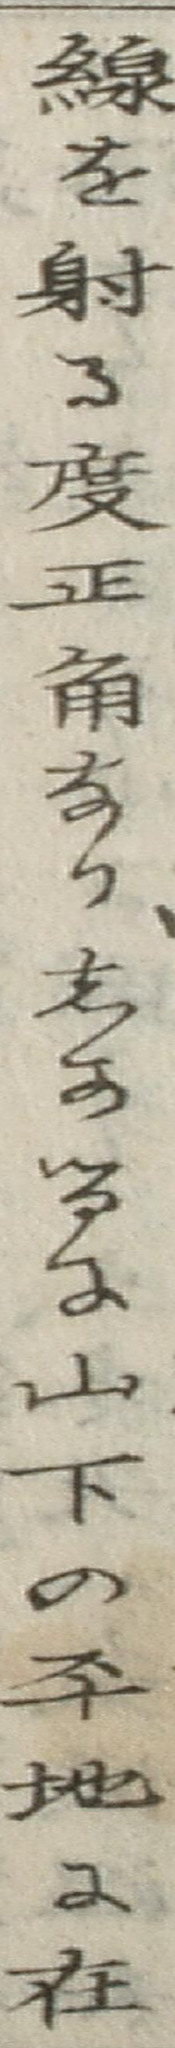線を射る度正角なり、しかるに山下の平地に在
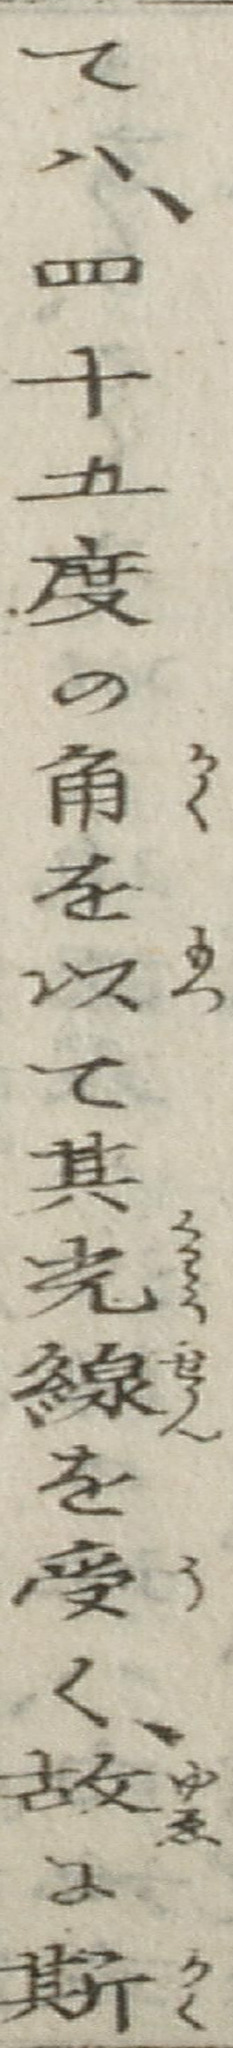ては、四十五度の角を以て其光線を受く、故に斯
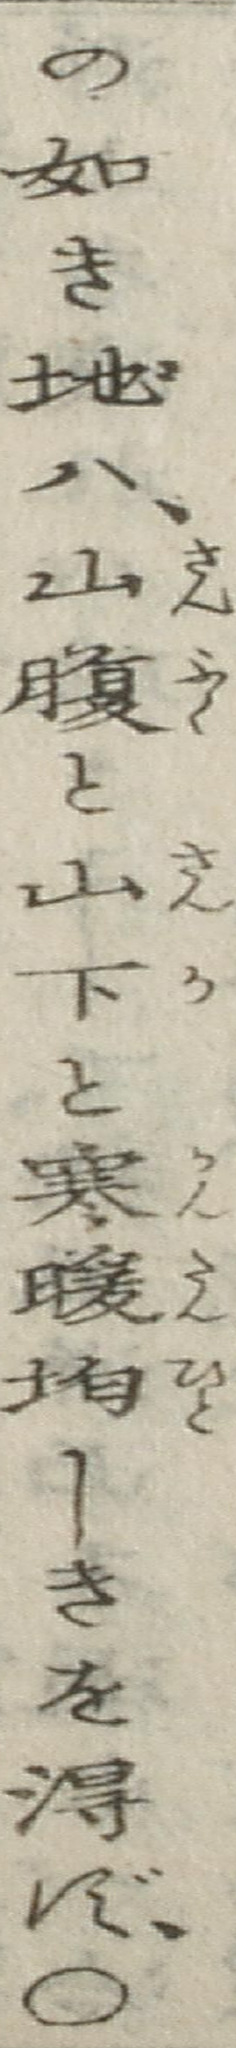の如き地は、山腹と山下と寒暖均しきを得ず、○
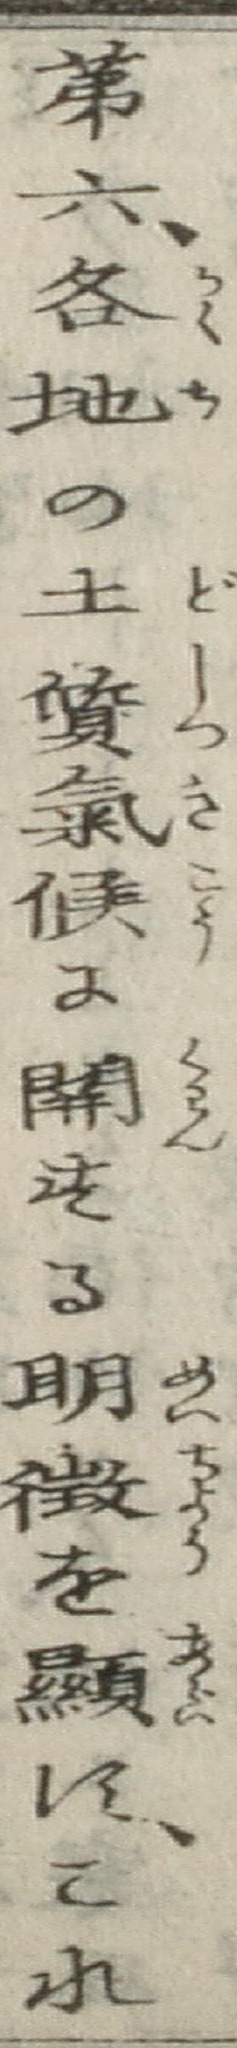第六、各地の土質気候に関する明徴を顕す、これ
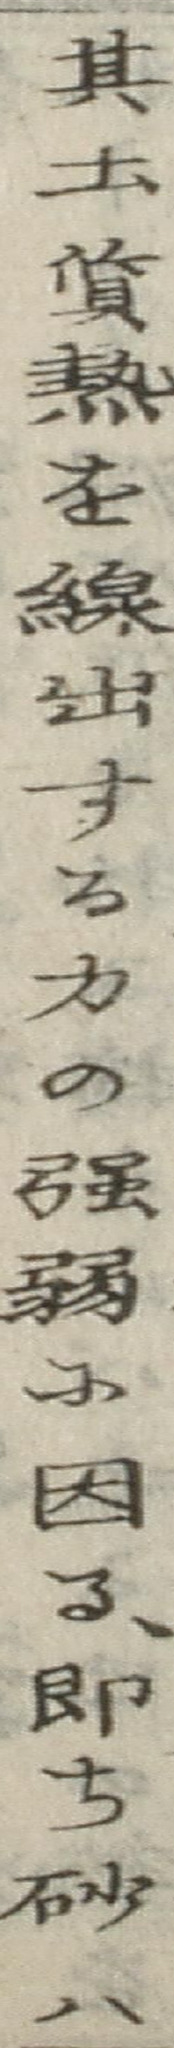其土質熱を線出する力の強弱に因る、即ち砂は
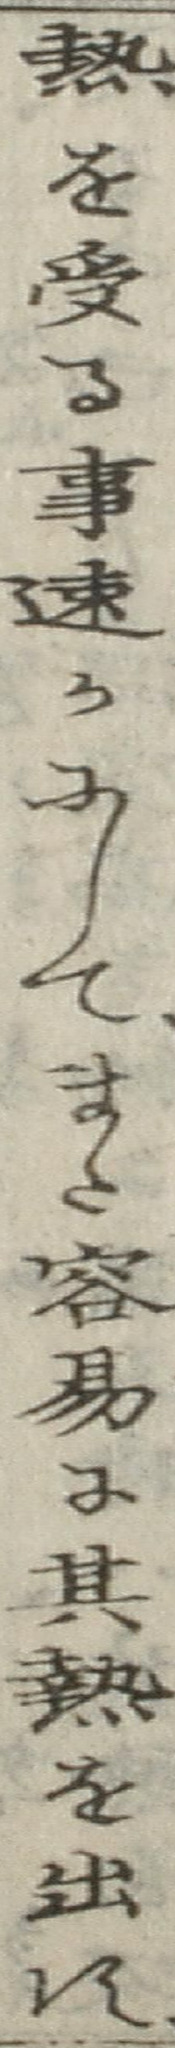熱を受る事速かにして、また容易に其熱を出す、
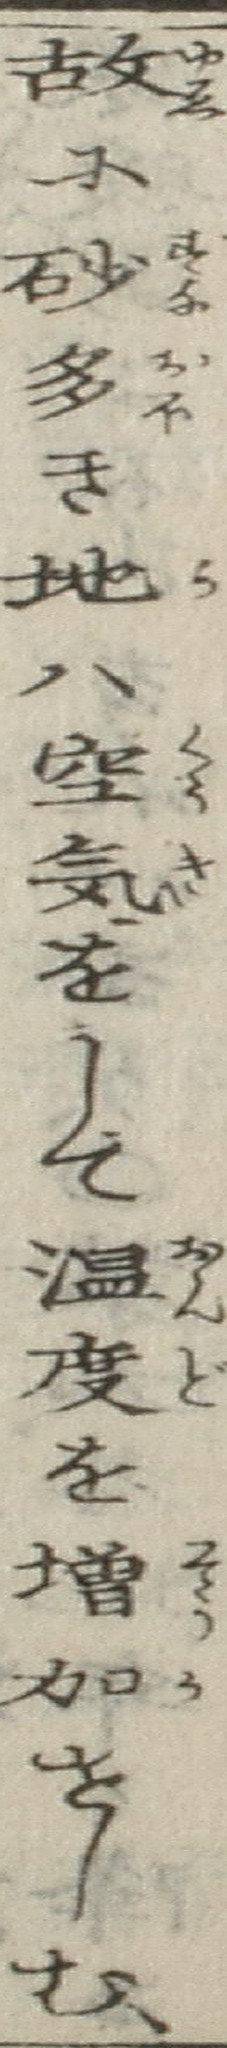故に砂多き地は空気をして温度を増加せしむ、
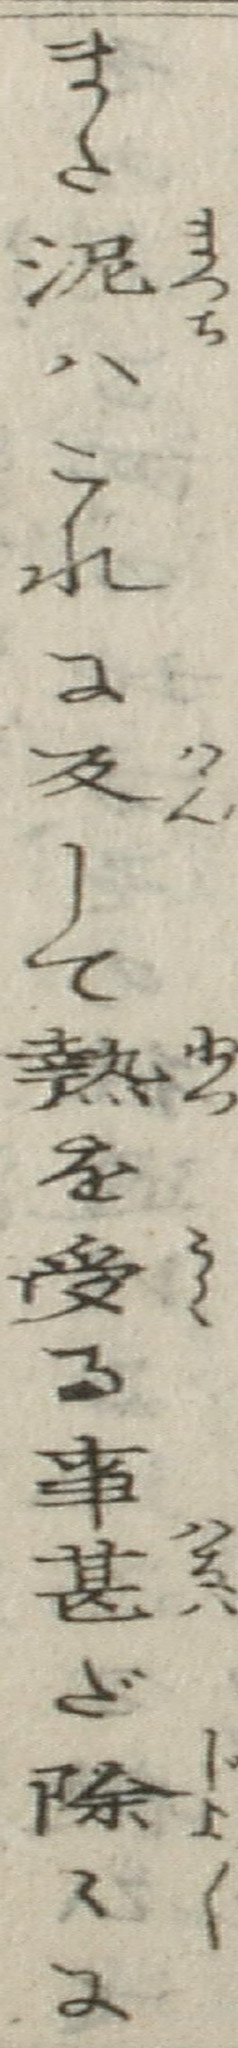また泥はこれに反して熱を受る事甚だ徐々に
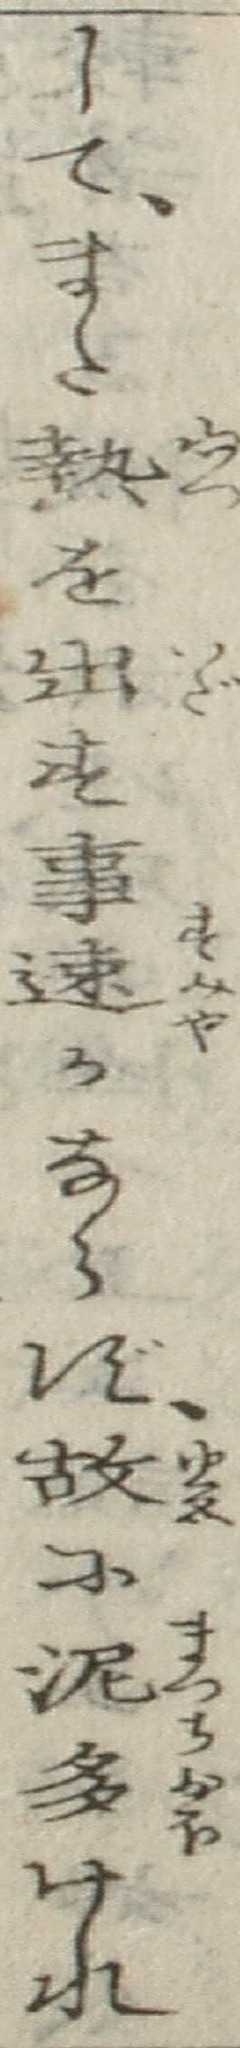して、また熱を出す事速かならず、故に泥多けれ
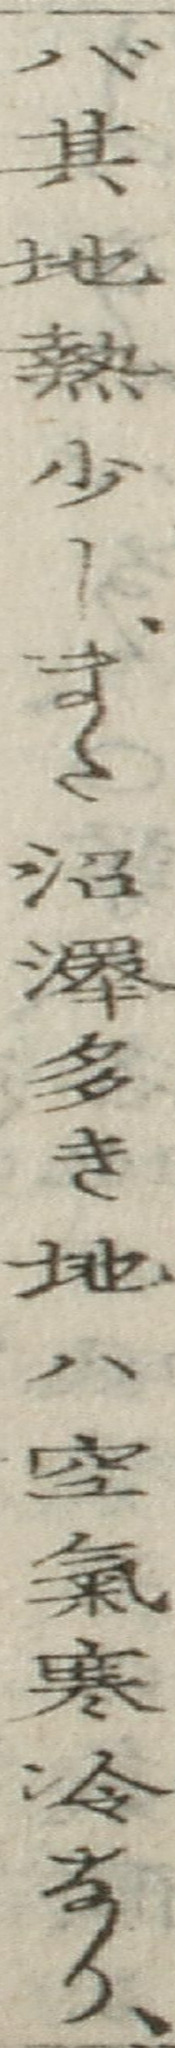ば其地熱少し、また沼沢多き地は空気寒冷なり、
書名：訓蒙　天然地理學　下
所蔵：東京大学地震研究所図書室 Earthquake Research Institute Library, The University of Tokyo, JAPAN
